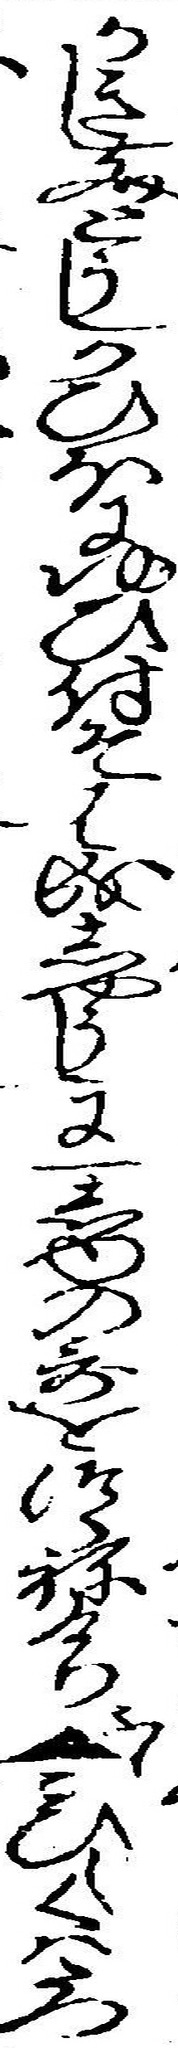かきし文とうしかひほにゆひ付そは成しやうしに一しゆの歌をつらねけりふし▲こひしくはたつ
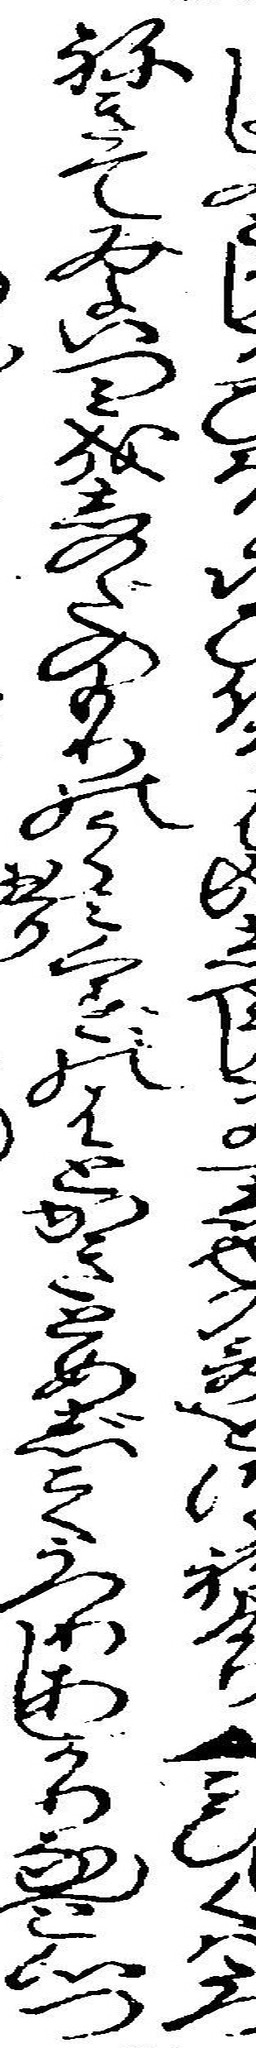ねきてみよいつみ成しのだのもりのうらみくずのはとかきとめじこくうつりあしかりなんと心つ
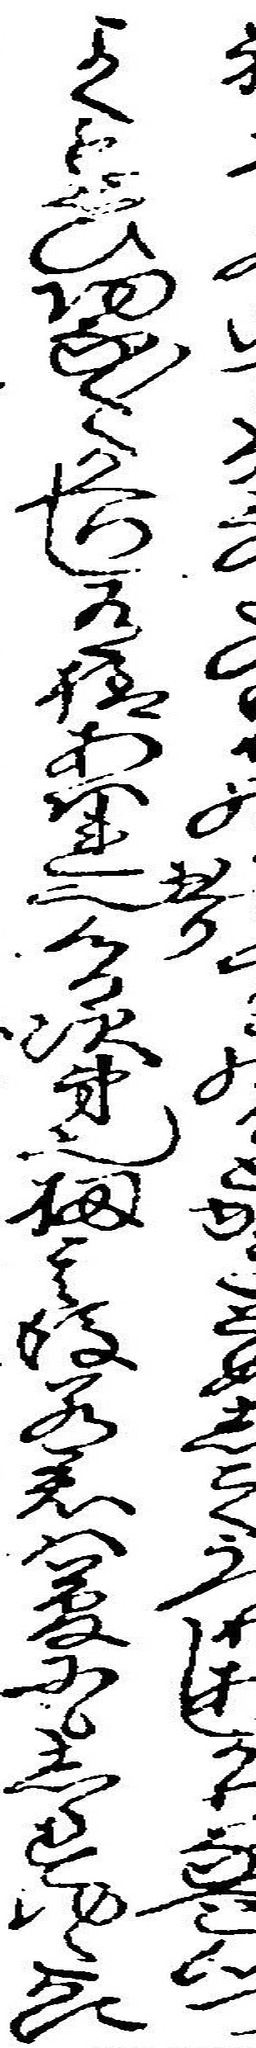よくも思ひ切なく〳〵かへりし有様あはれ也ける次第也扨其後若君は夢にもしらすゆたかに
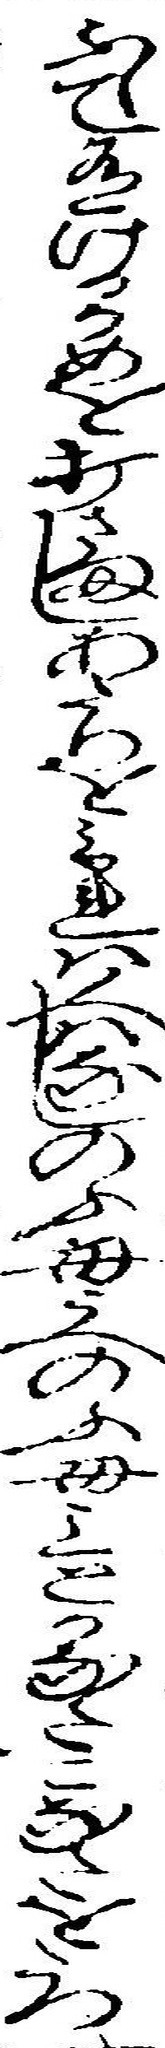ふして有けるかめを打さましあたりをみれは人はなしのふ母うへのふ母上とかなたこなたをたつ
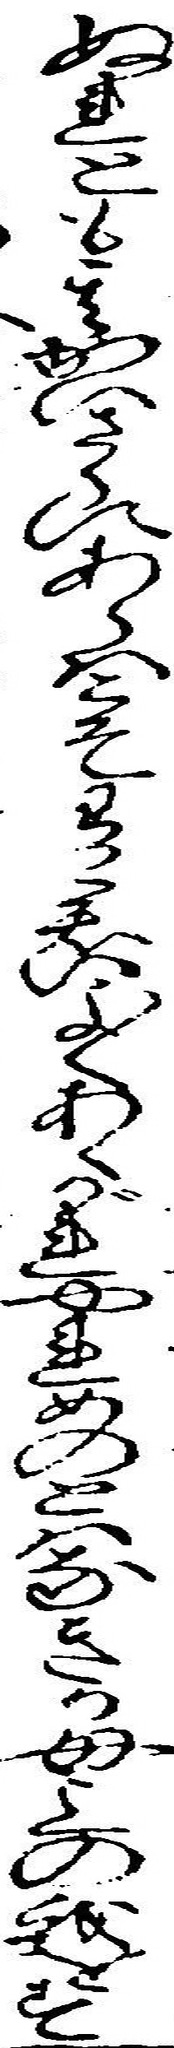ぬれとも其かいさらにあらはこそわか君いよ〳〵あくがれやれめのとはなきか母上の我をす
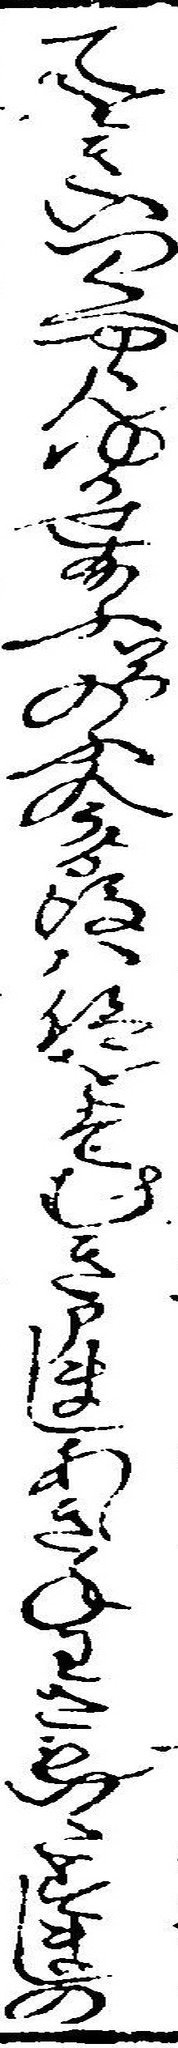てをきいつくへやらんゆかせ給ふいろのふ今ゟ後は仰をそむき申ましあしき手わさもいたすましの
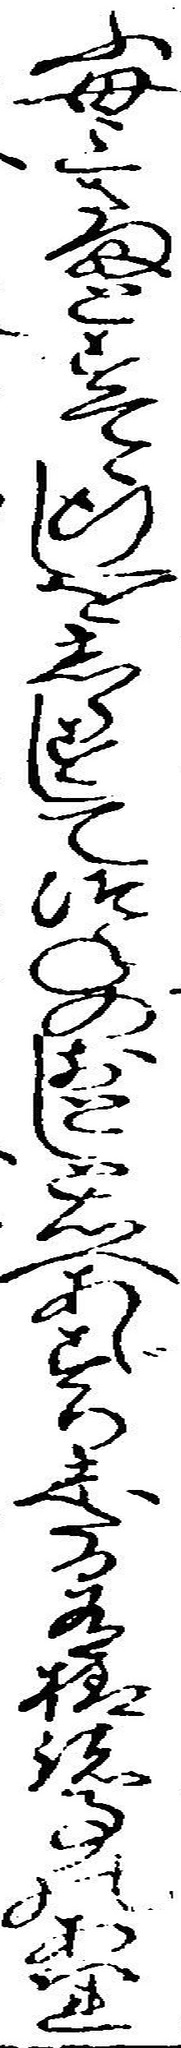ふ母上さまとすてゝ行しをしらすしてつねのおとしと心へあしずりしたる有様諸事のあはれ
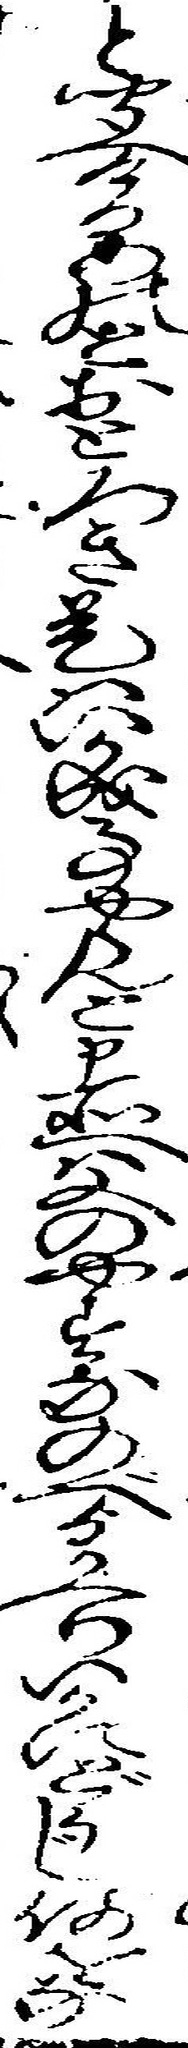と聞へけるめのとおとろき是はいか成事やらんと申所へ父のやすなのべゟかへりいかにどうじ何をな
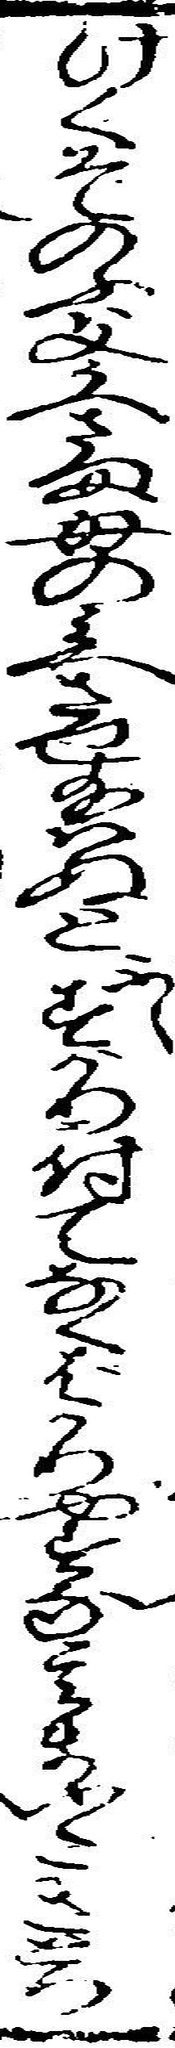けくそのふ父うへさま母のみへさせ給はぬとふしすかり付てなくばかりやすな其まゝいたきとり
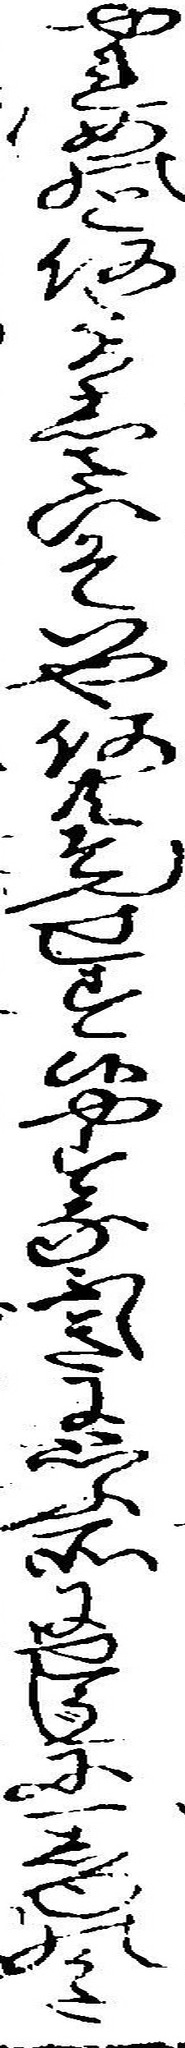やれめのと何たるしさいそいや何共そんせす候やすなふしきに思ふ所にせうしに一しゆのうた
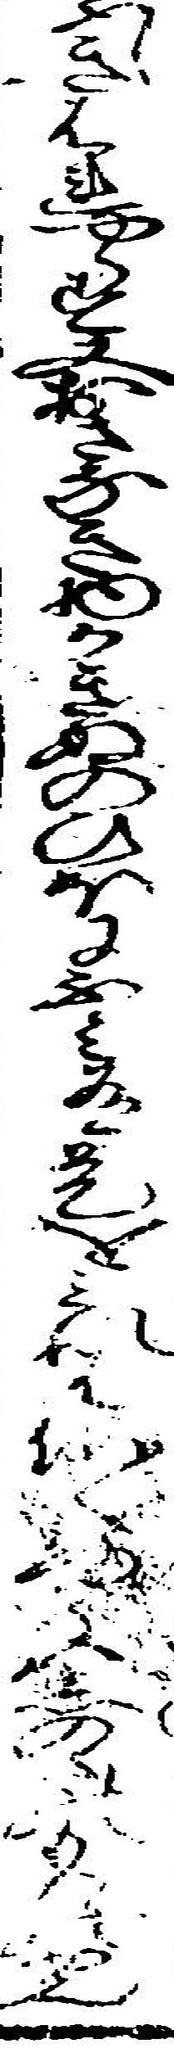ふしきはれやらす又おさなき物かきぬのひほにふみ有是をみれはしのたのもりやかん
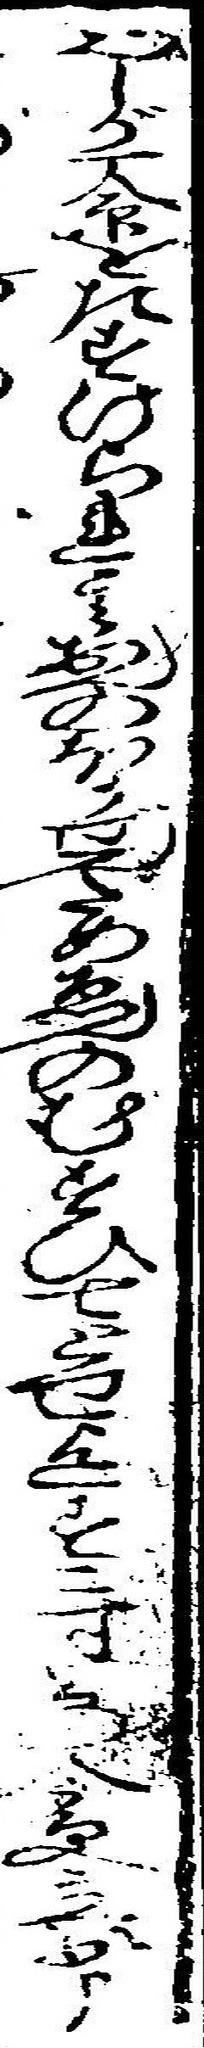也しが一命をたすけられ其おんのほうぜんためゑんのむすひ七とせ迄すこす今更申
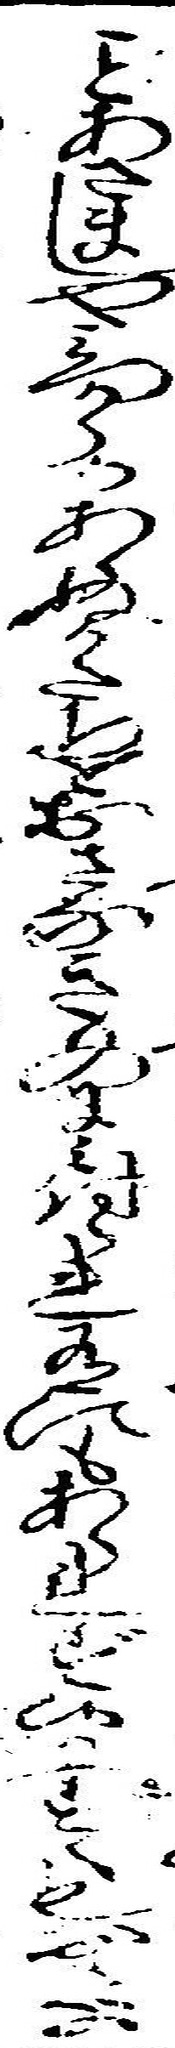ことあさましやみつからかあらぬかたちをおさなきものにみ付られ有にもあられず候かへす〳〵もおさな
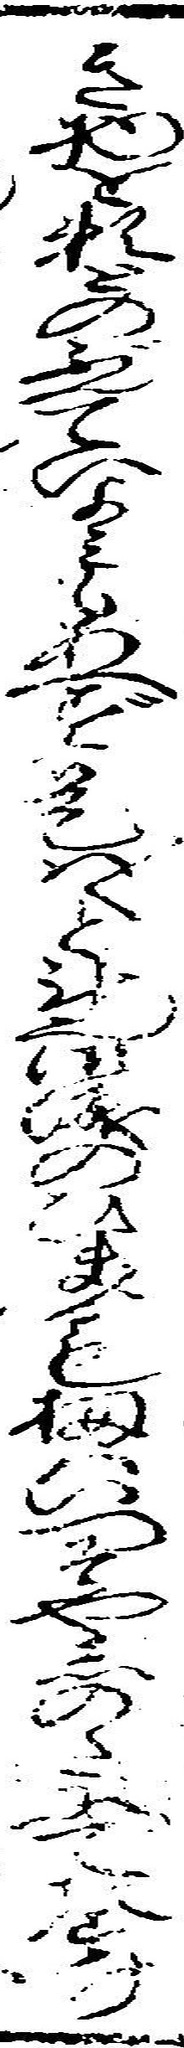き物を頼とのぶんていよみもあへず是は〳〵と斗也御涙のひまゟも扨はいつそやしのたにてたすけ
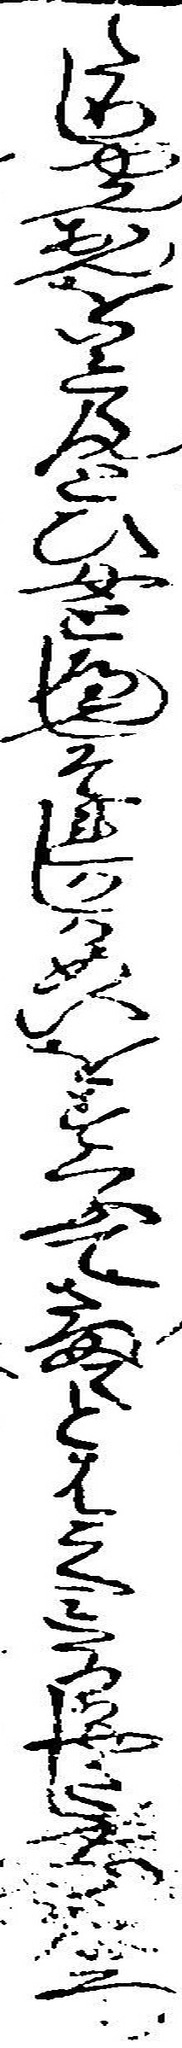たりしやかんおんをいとらんとひ女とへんしそれかしかめいをすくふてさま〳〵とはこくみたるかやさしきやち
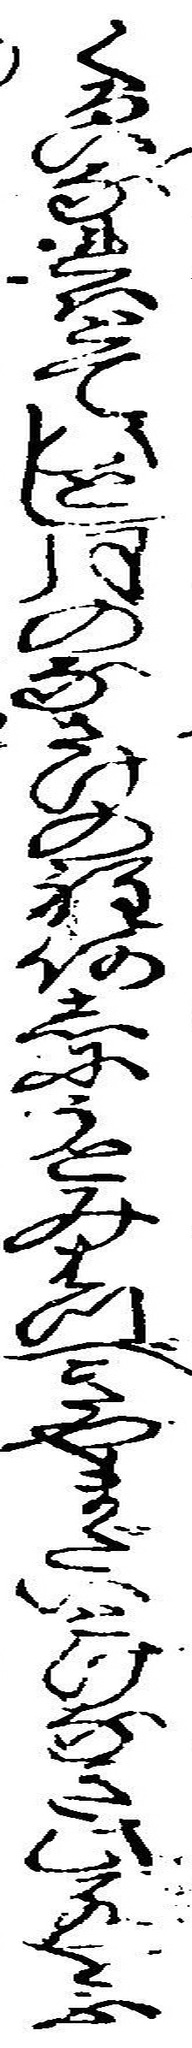くるいなれはとて此とし月のなさけの程何しにうとみはつべきやまだいとけなき此子をふ
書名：[しのだづまつりぎつね付あべの清明出生]
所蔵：東京大学総合図書館 General Library in the University of Tokyo, JAPAN
